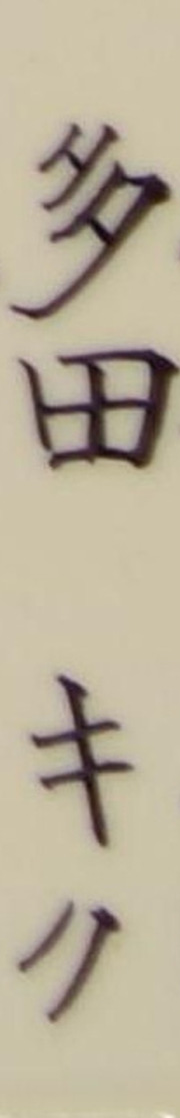多田キク
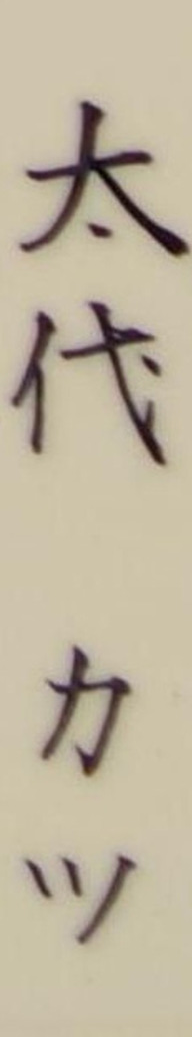太代カツ
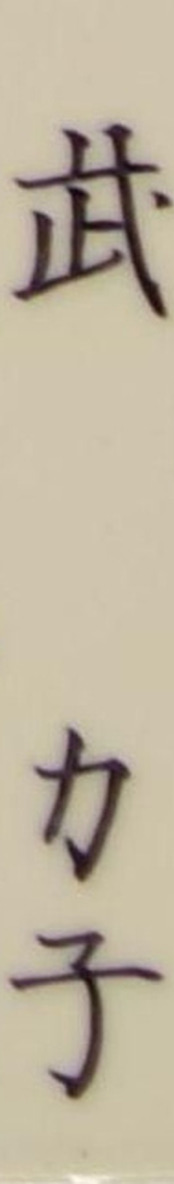武カ子
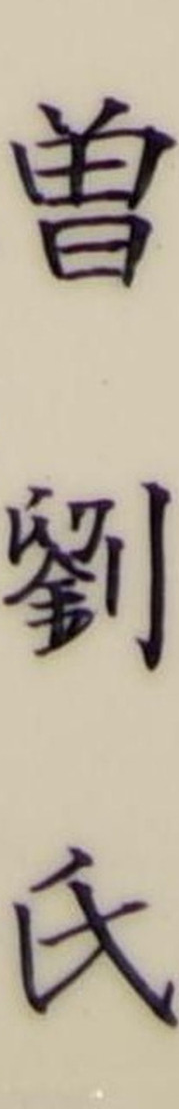曽劉氏
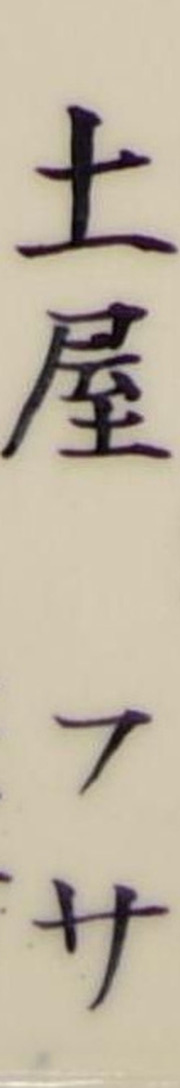土屋フサ
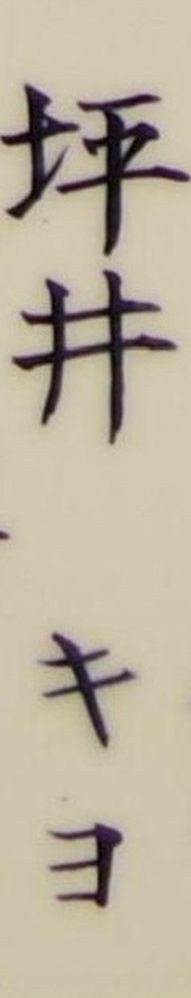坪井キヨ
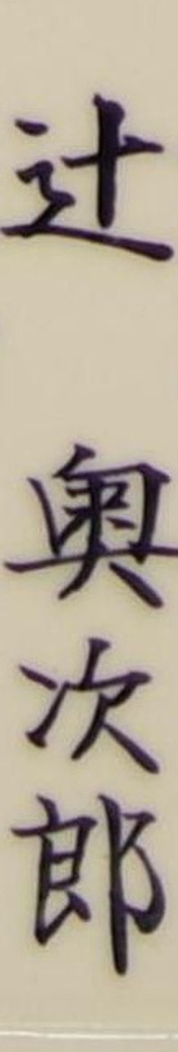辻奥次郎
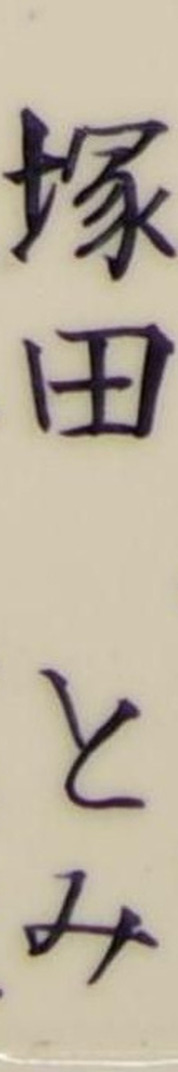塚田とみ
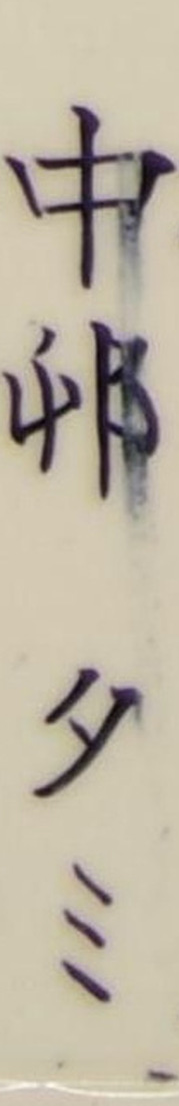中邨タミ
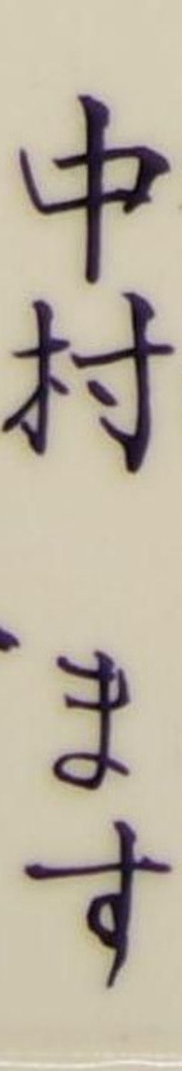中村ます
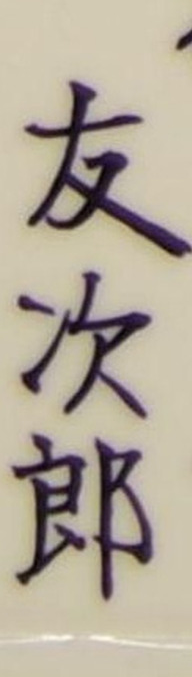友次郎

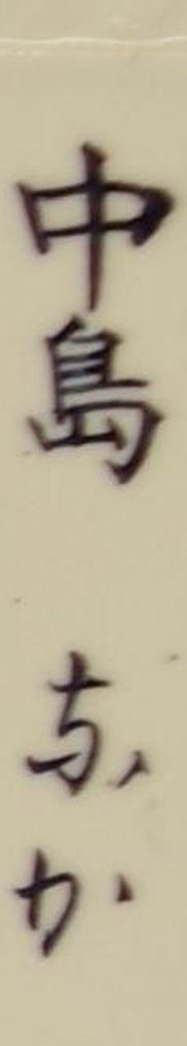中島なか
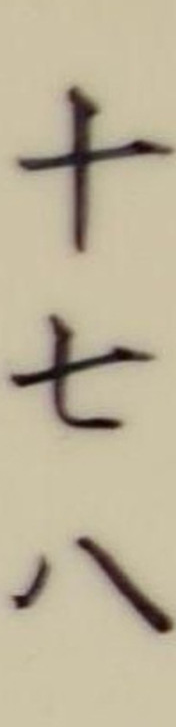十七八
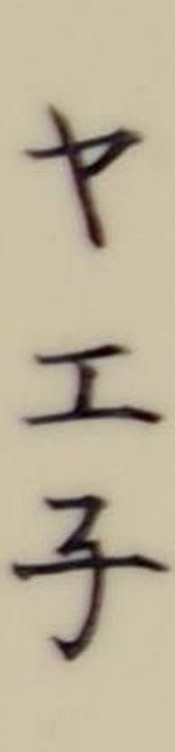ヤエ子
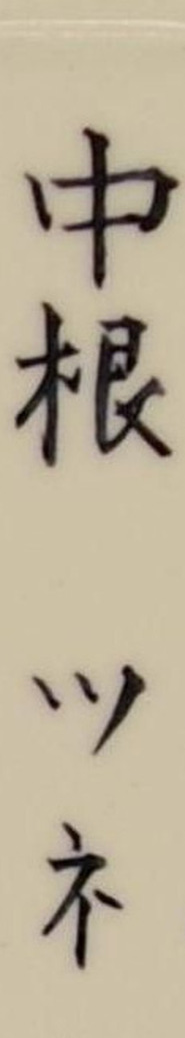中根ツネ
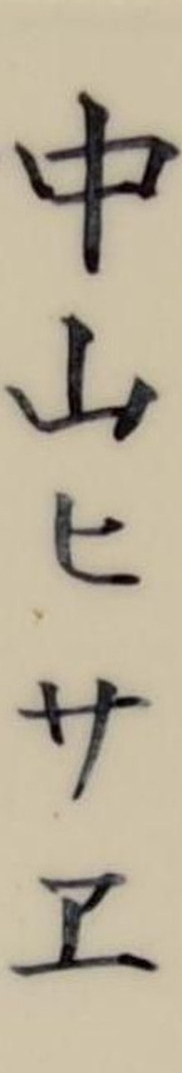中山ヒサヱ
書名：A~D
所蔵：koyasan kongobuji
